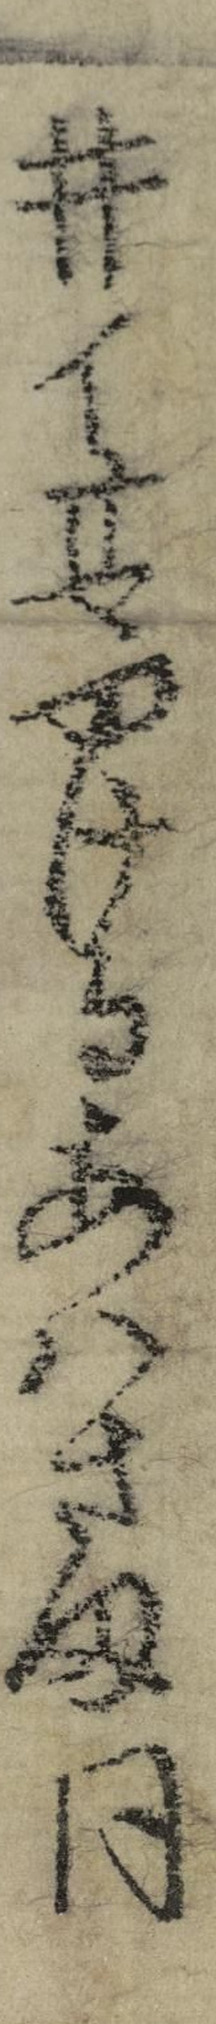井イサマやけるあハさま同
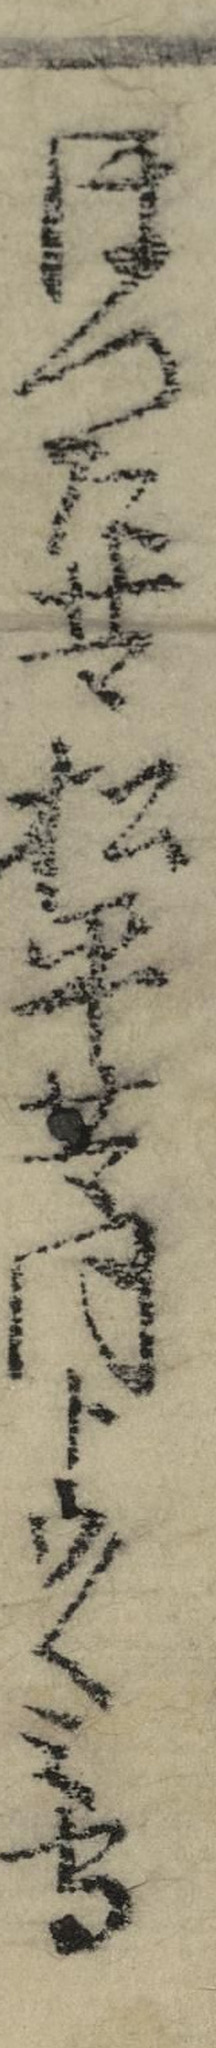ほつたサマ松平サマ同トウ〳〵ミ守
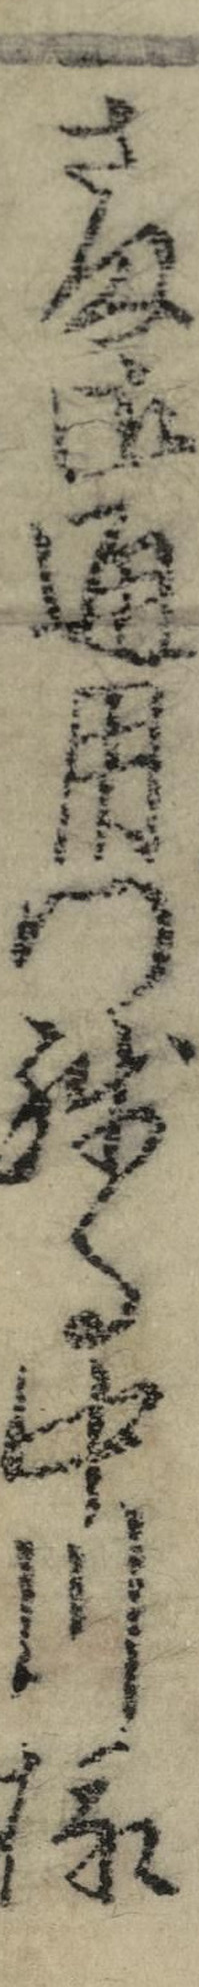さま御通用門残る中川様
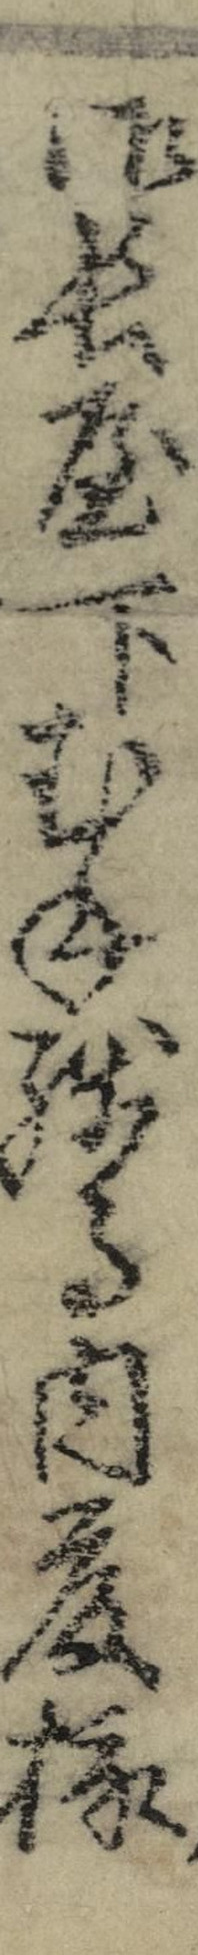御長屋下むね残る内藤様
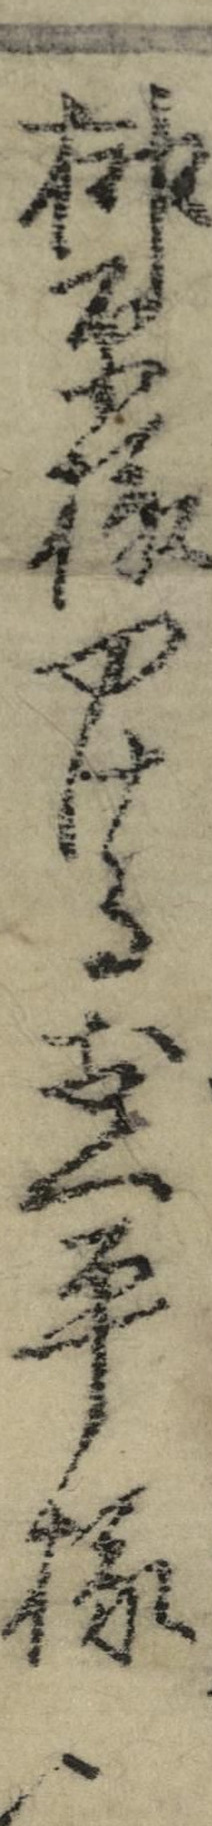榊原様やけるおく平様
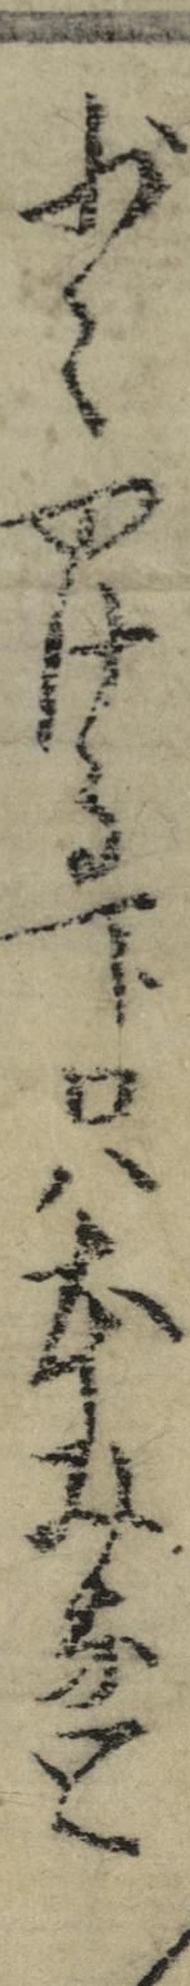少々やける一ㇳ口ハ本みなと
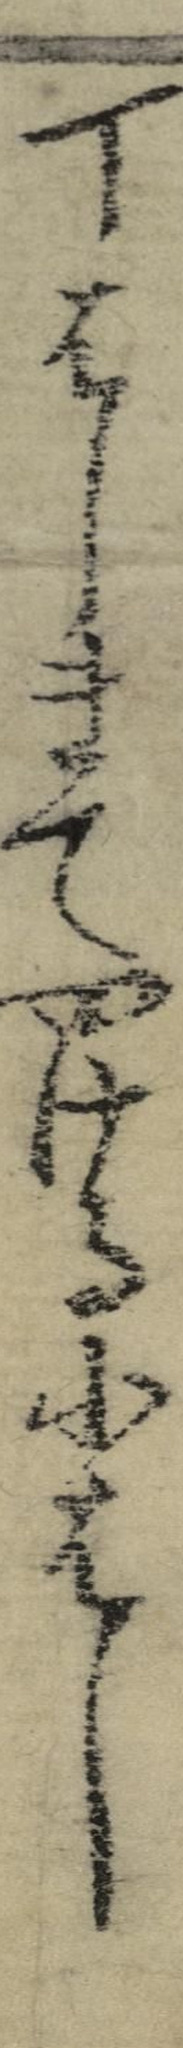丁はしまてやける小はし
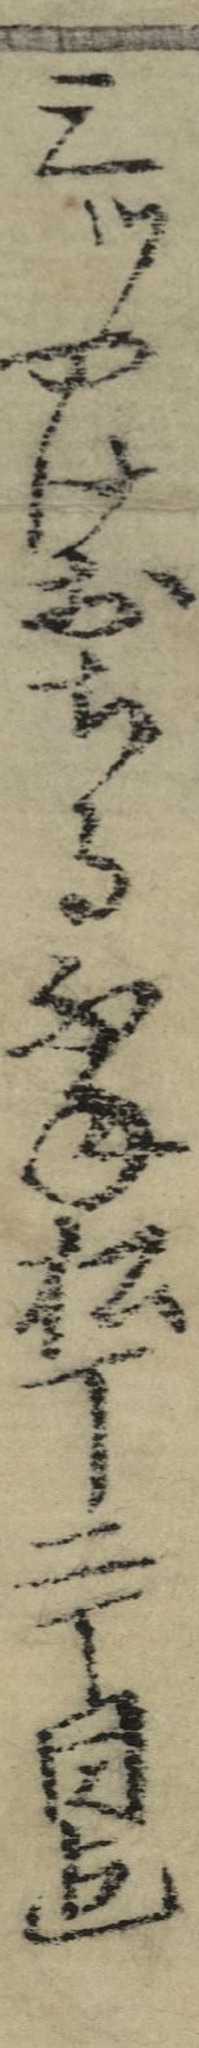三ッやけおちるふな松丁二丁目迄
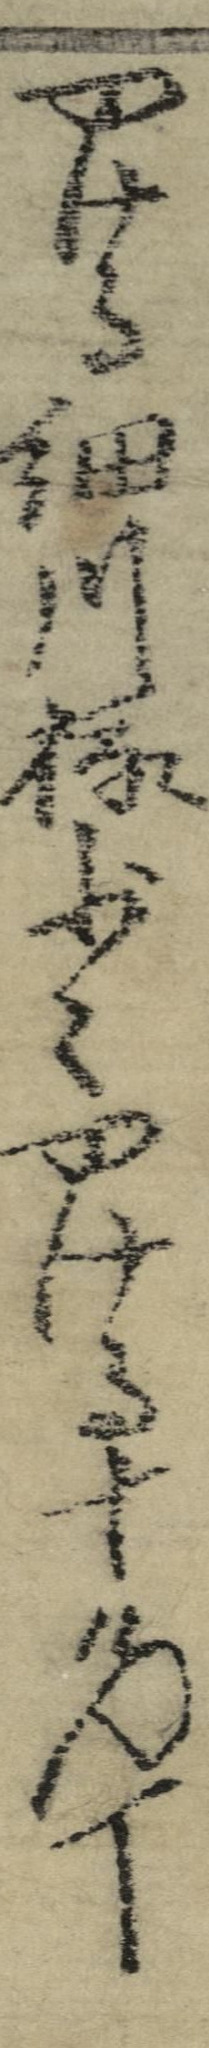やける細川様少々やける十けん丁
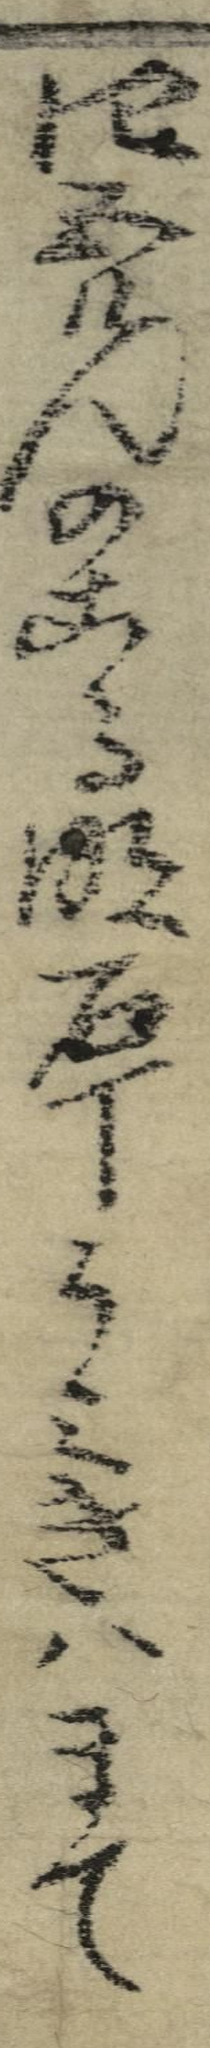四五けんのこる明石丁うミきハまて
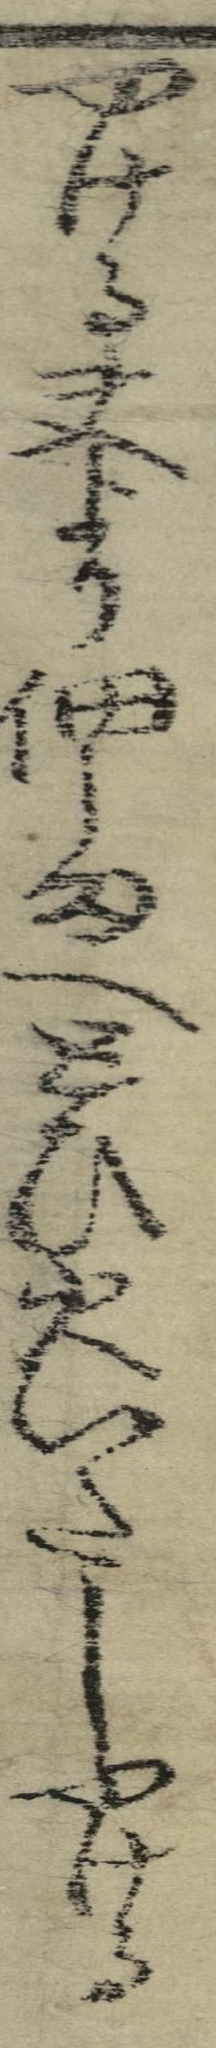やける夫より佃しまへとひ火いたしやける
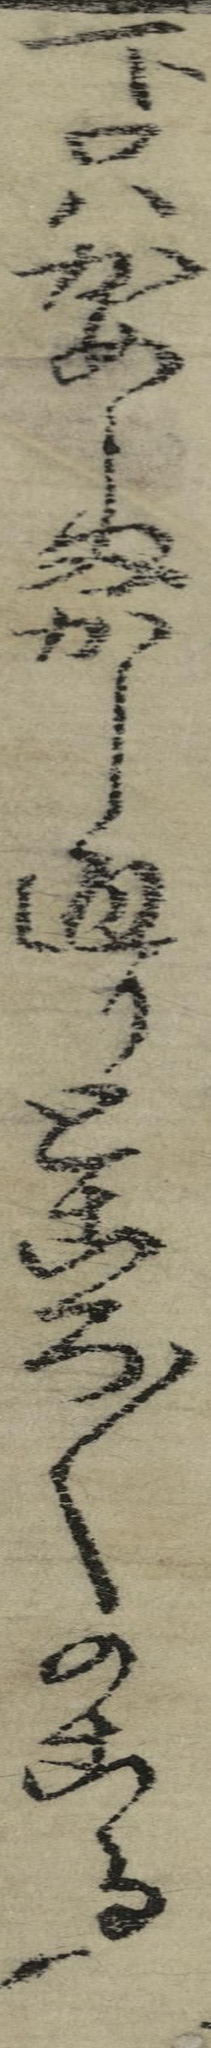一ㇳ口ハかめしまかし通りところ〳〵のこる
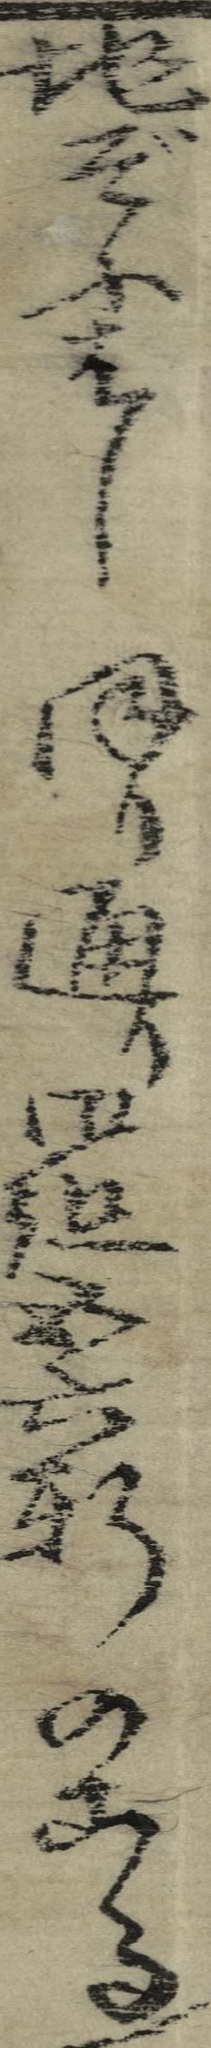地ぞふはし廻り通り御組五六軒のこる
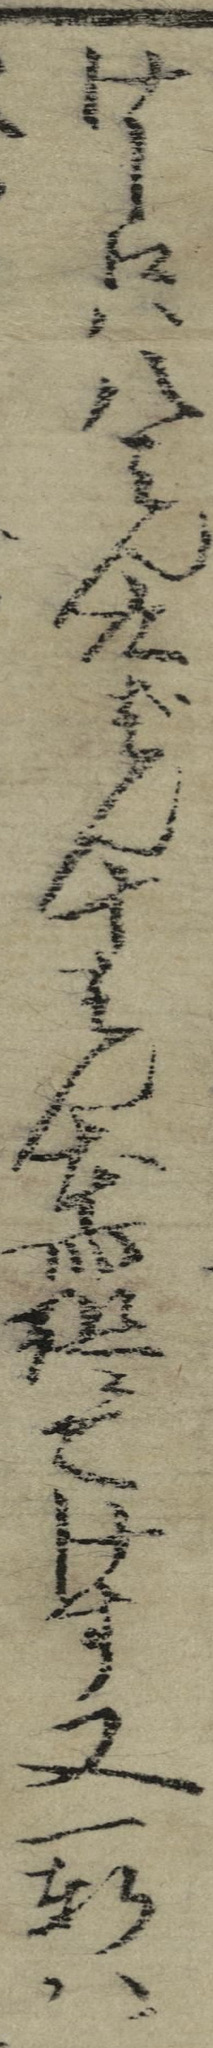けし口ハ八はん九ばん十はん本御組二てけす又一軒ハ
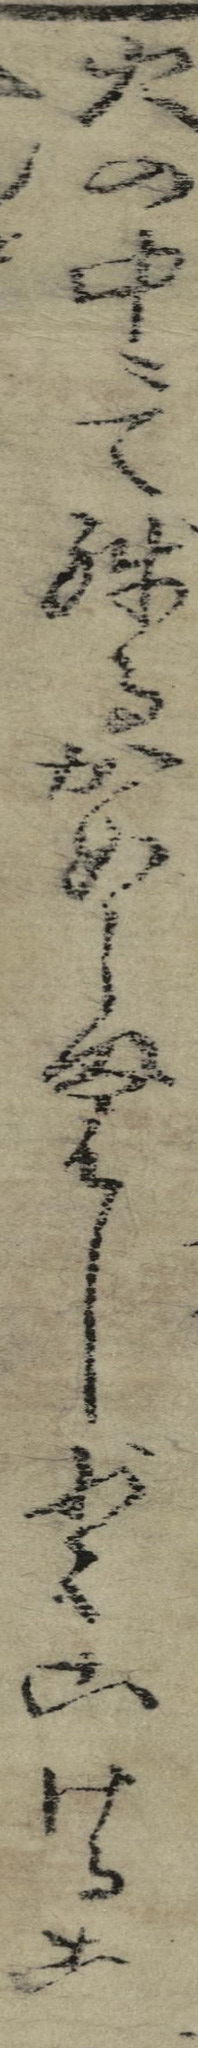火の中二て残るかめしまはし少々やけるこの
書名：[慶応二年十一月の江戸大火に関する瓦版]
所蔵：東京大学地震研究所図書室 Earthquake Research Institute Library, The University of Tokyo, JAPAN
